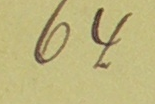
64
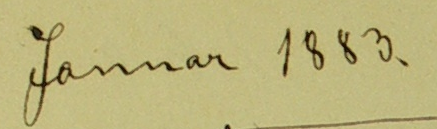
Januar 1883
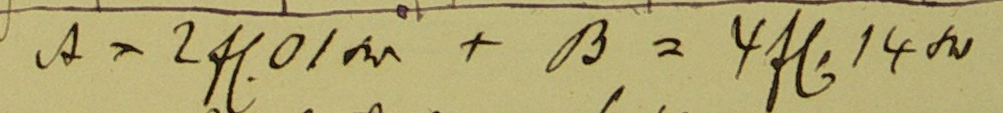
A = 2 Fl. 01 Tr + B = 4 Fl. 14 Tr
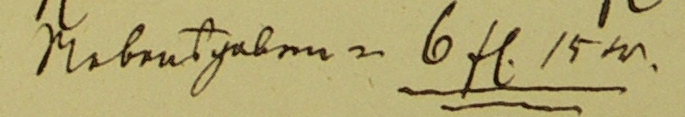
Nebenausgaben = 6 Fl. 14 Tr
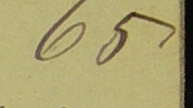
65
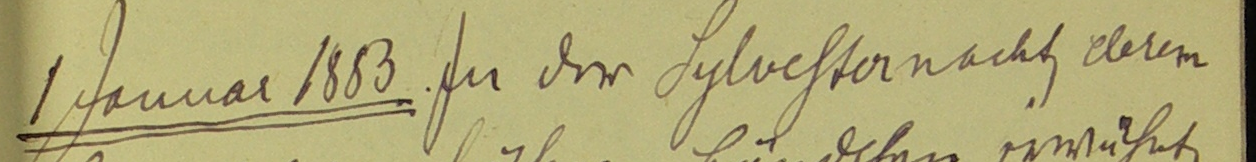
1 Januar 1883. In der Sylvesternacht deren
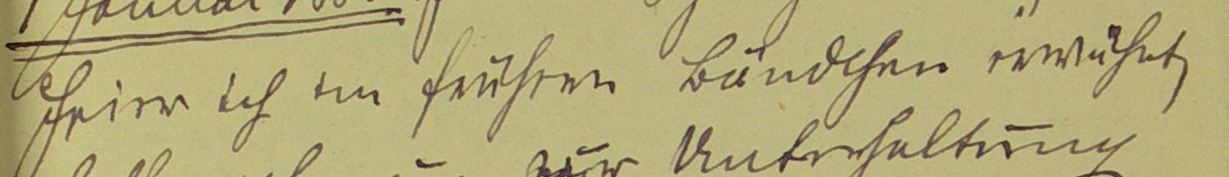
Feier ich in früheren Bändchen erwähnt,
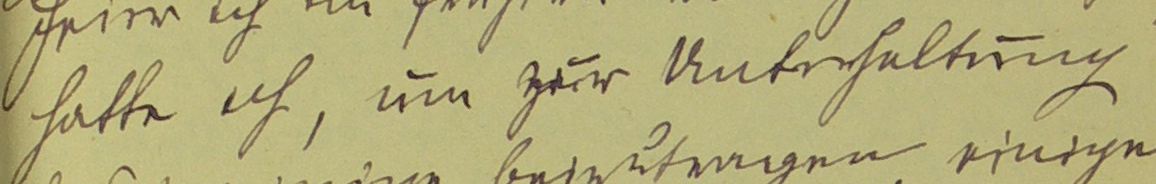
hatte ich, um zur Unterhaltung
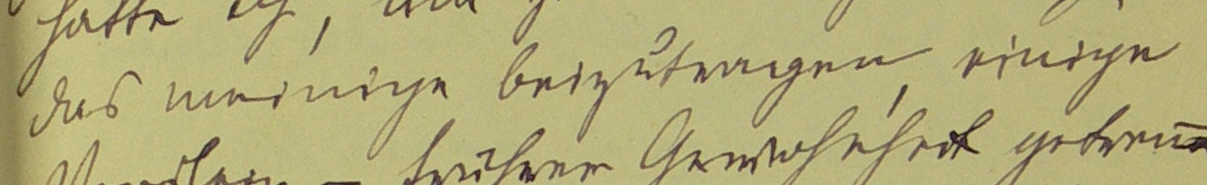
das meinige beizutragen, einige
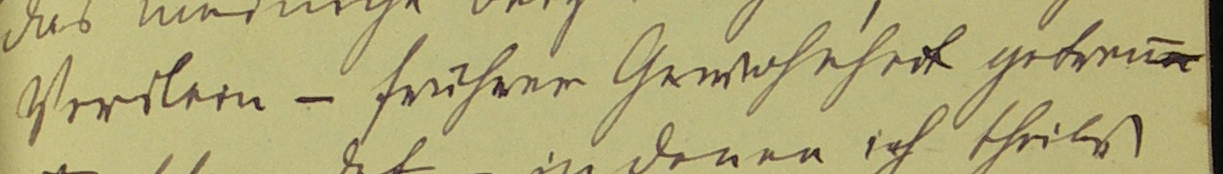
Verslein - früherer Gewohnheit
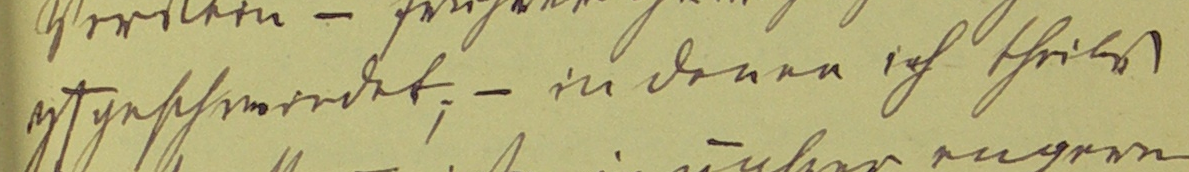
ztgeschmiedet, - in denen ich theils
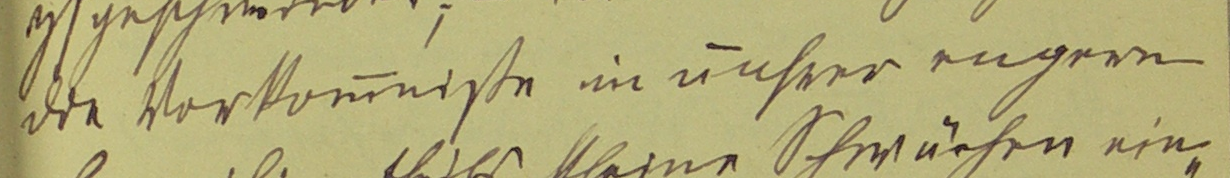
die Vorkommniße in unserer engen
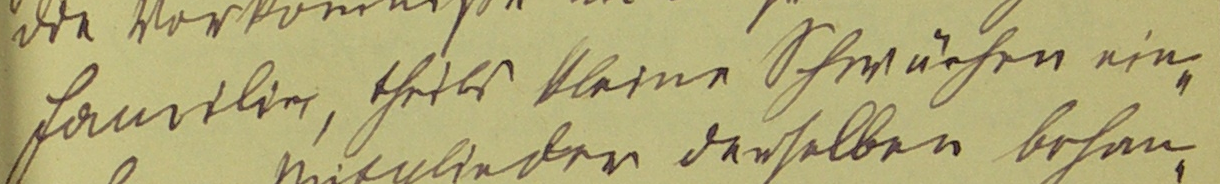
Familie, theils kleine Schwächen ein¬
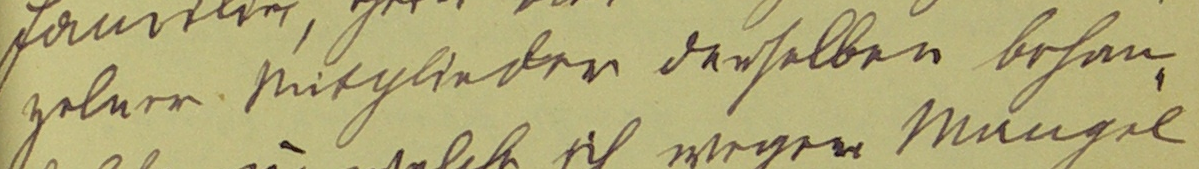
zelner Mitglieder derselben behan¬
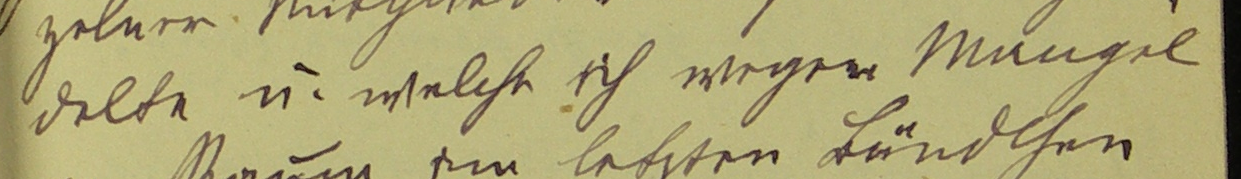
delte u. welche ich wegen Mangel
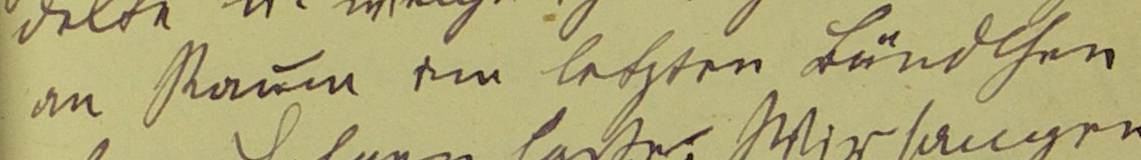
an Raum im letzten Bändchen
